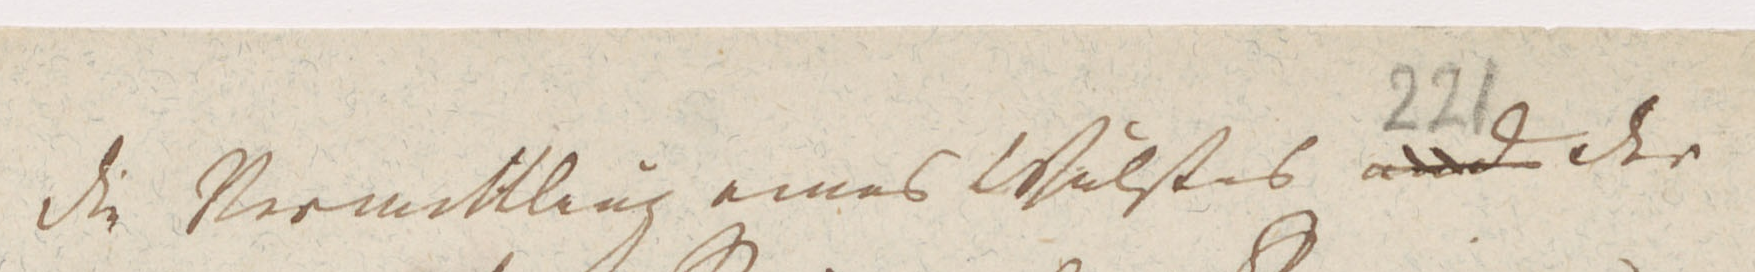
die Vermittlung eines Wulstes und der
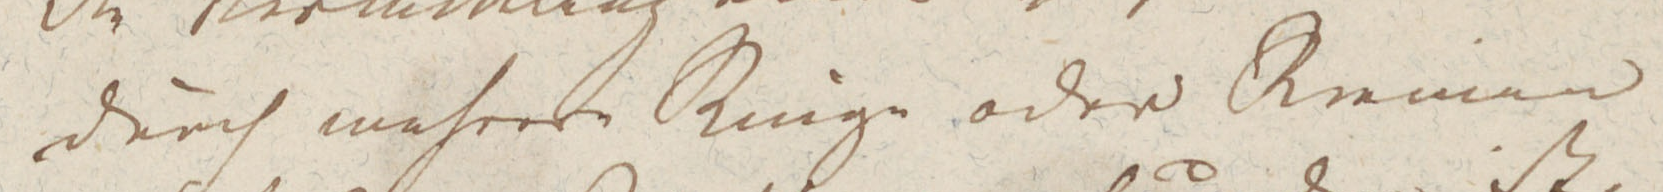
durch mehrere Ringe oder Riemen
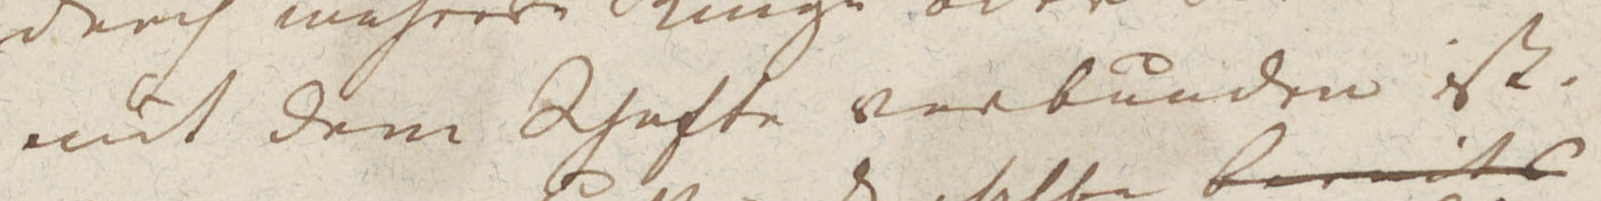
mit dem Schafte verbunden ist.
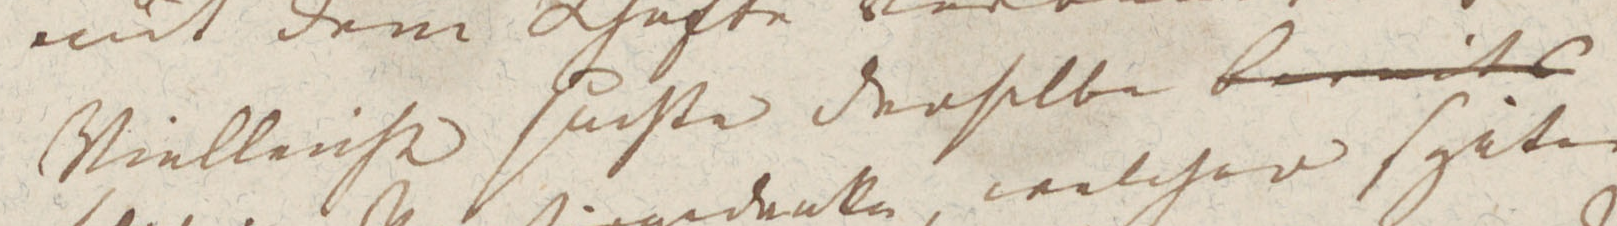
Vielleicht suchte derselbe bereits
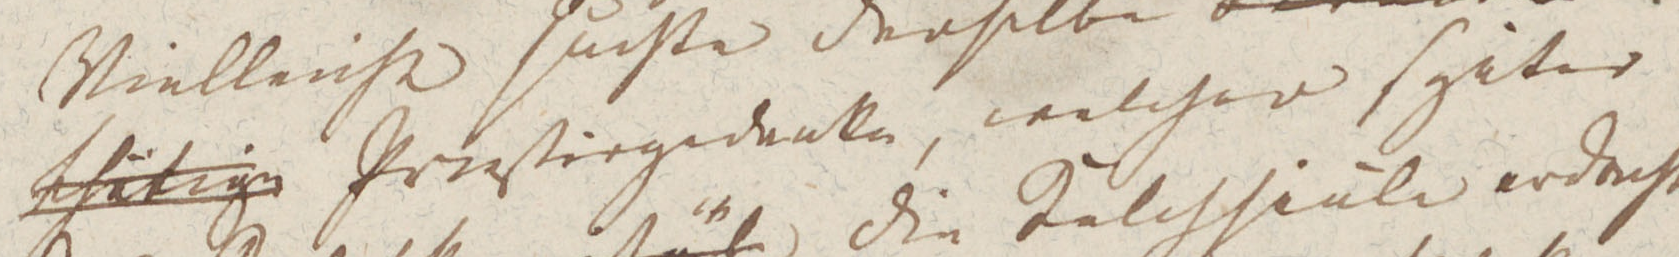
schätzige Priestergedanke, welcher später
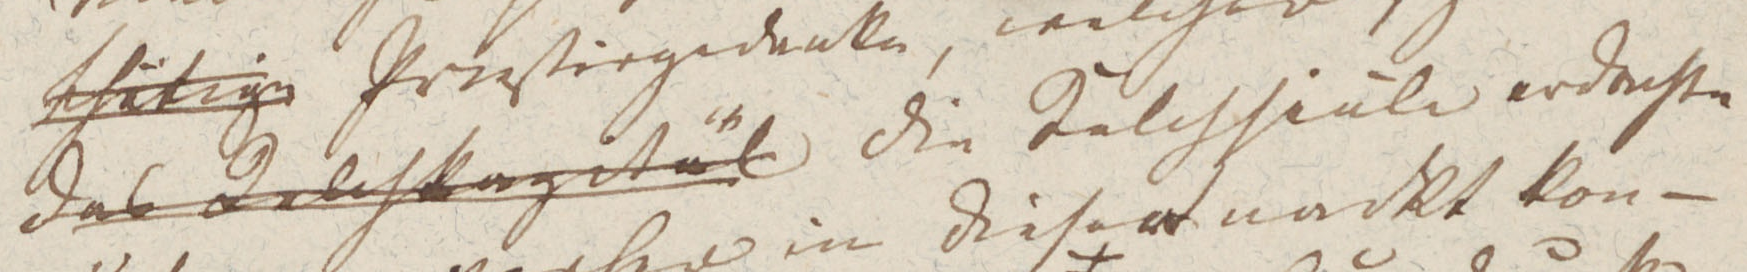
das Kelchkapitäl die Kelchsäule erdachte
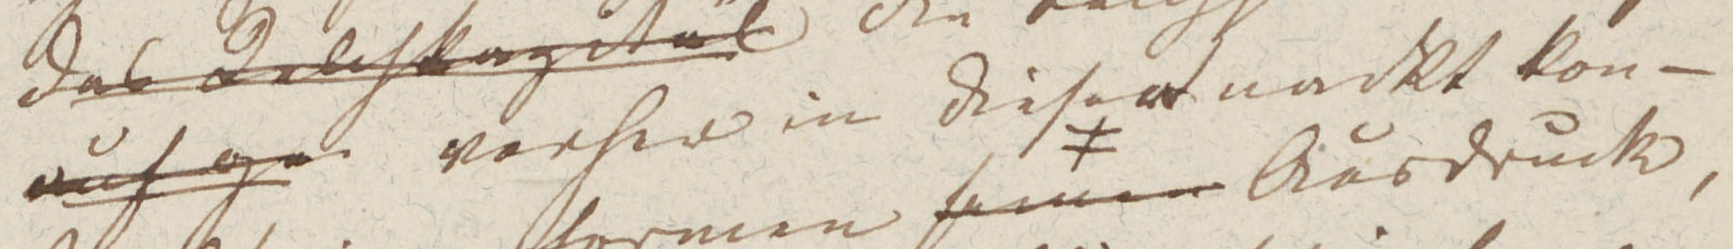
auf ge vorher in diesen nackt kon-
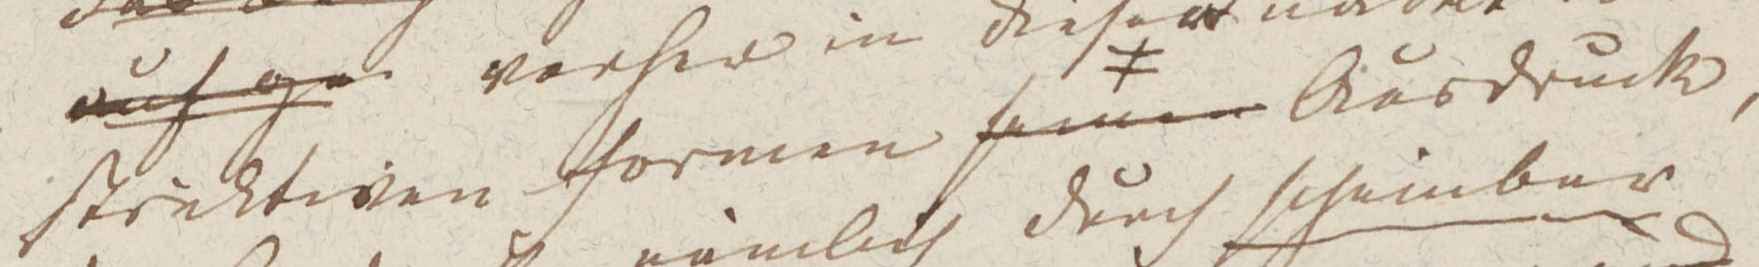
struktiven Formen seinen % Ausdruck,
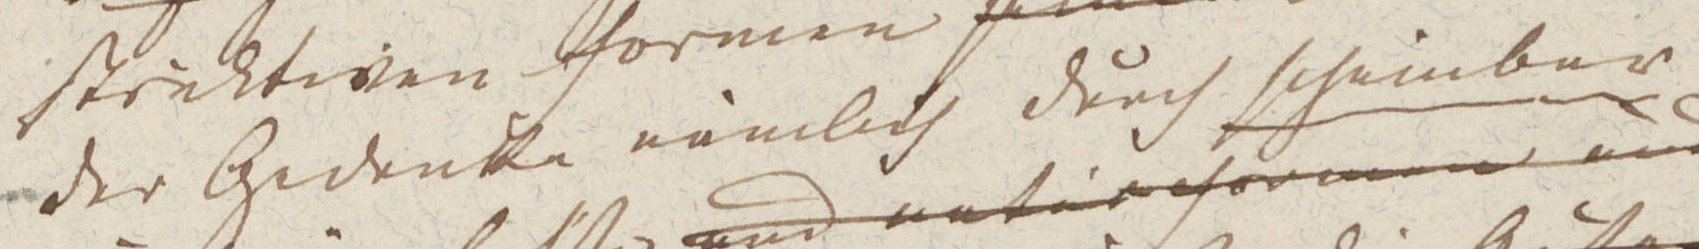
der Gedanke nämlich durch scheinbar
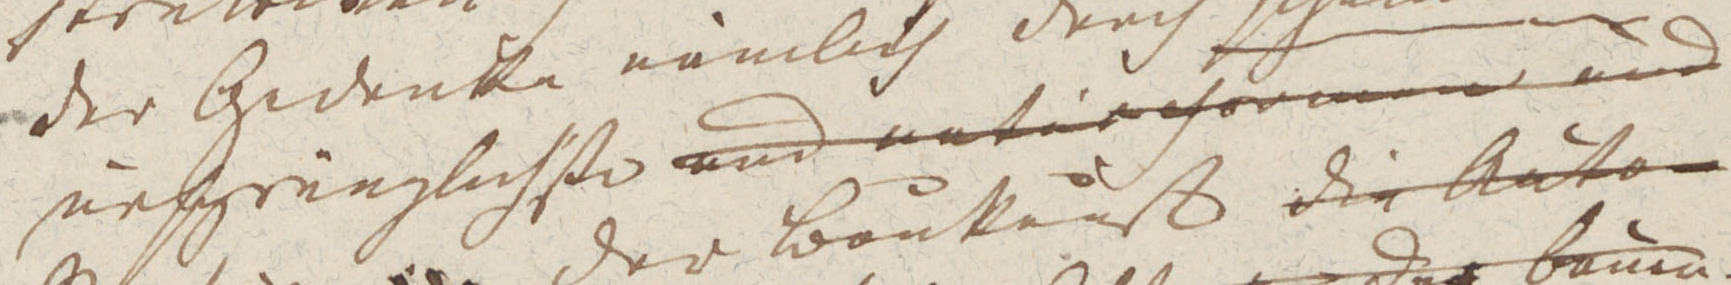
ursprünglichste und natur Formen und
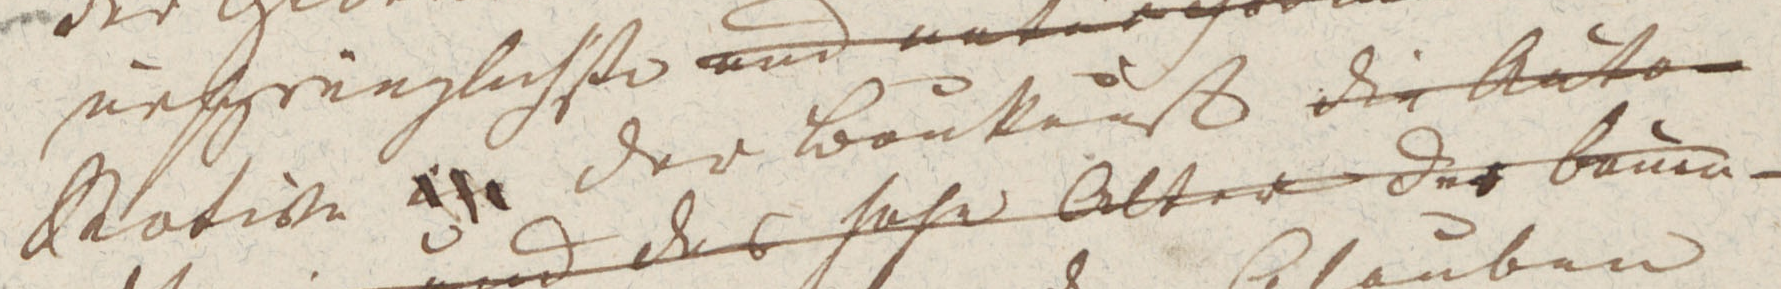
Motive in der Baukunst die Auto-
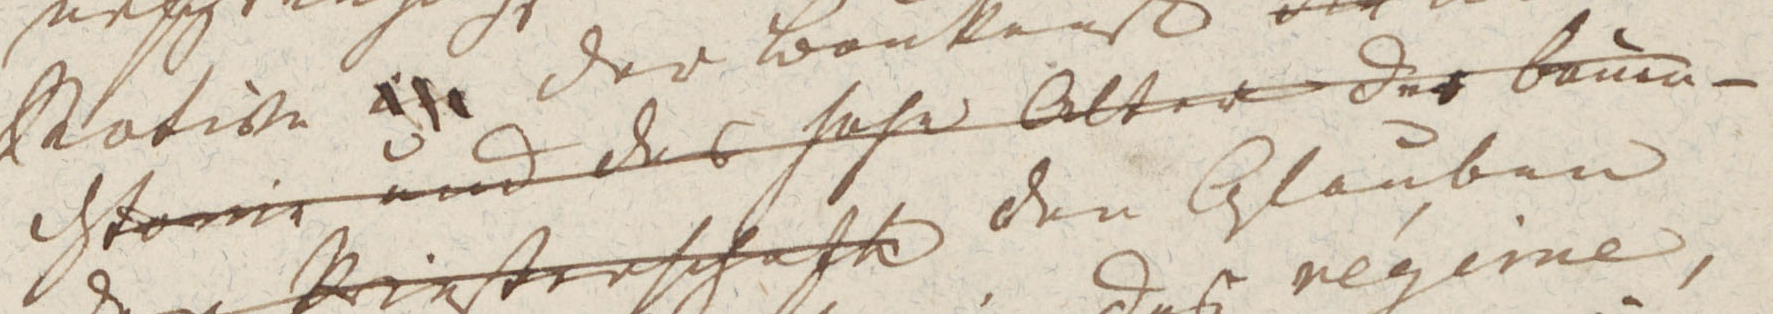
chtonie und das hohe Alter der bauen-
